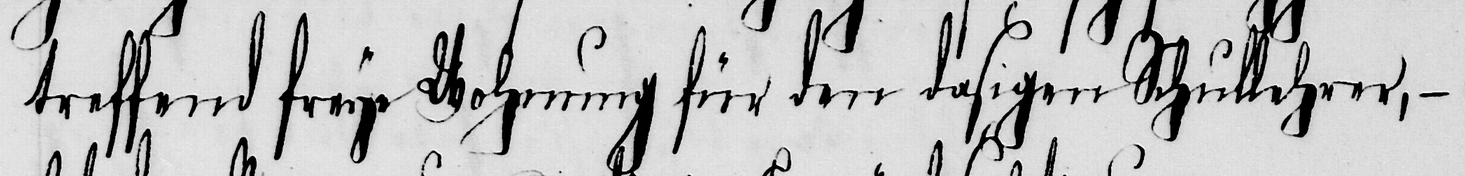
treffend freye Wohnung für den dasigen Schullehrer, –
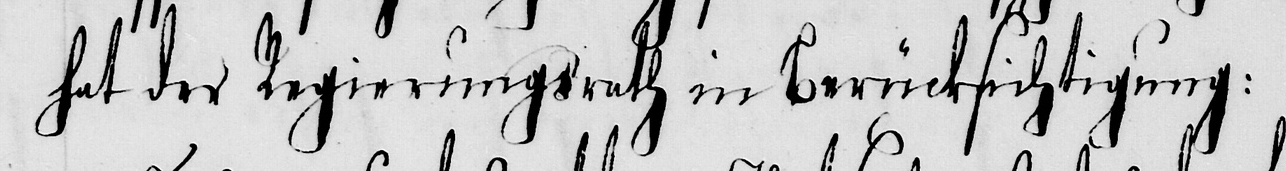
hat der Regierungsrath in Berücksichtigung:
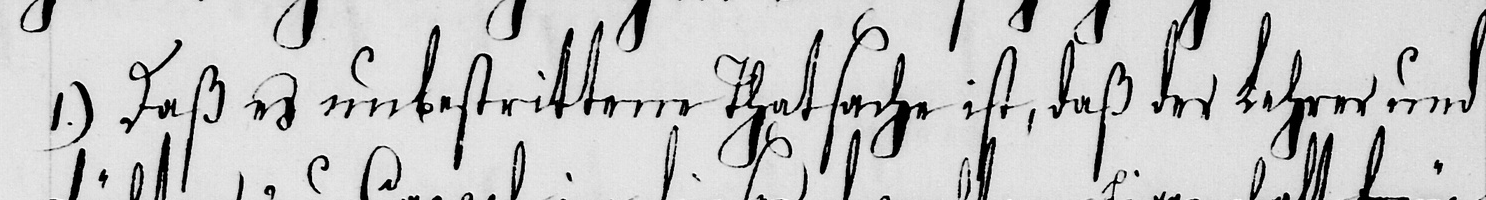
1.) Daß es unbestrittene Thatsache ist, daß der Lehrer und
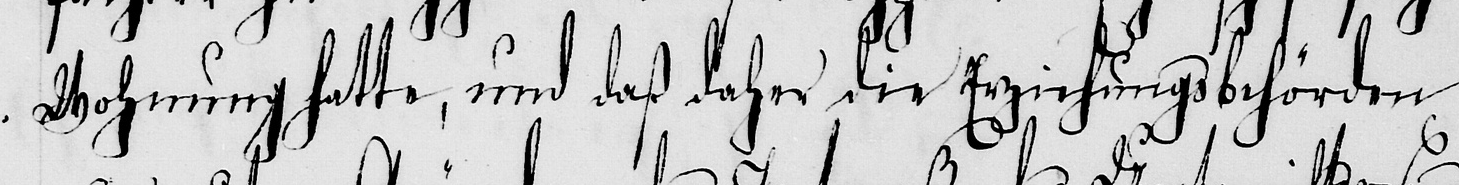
Wohnung hatte, und daß daher die Erziehungsbehörden
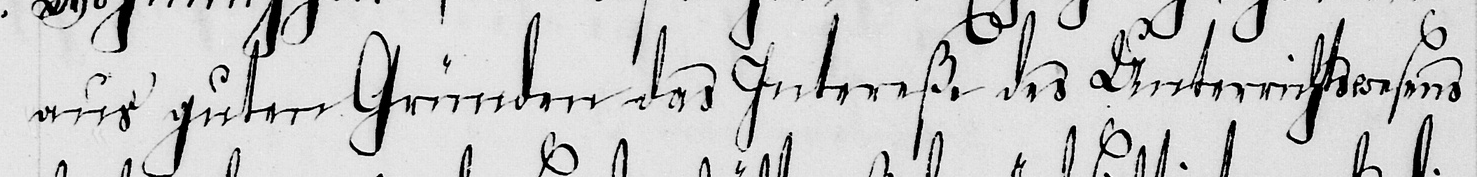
aus guten Gründen das Intereße des Unterrichtswesens
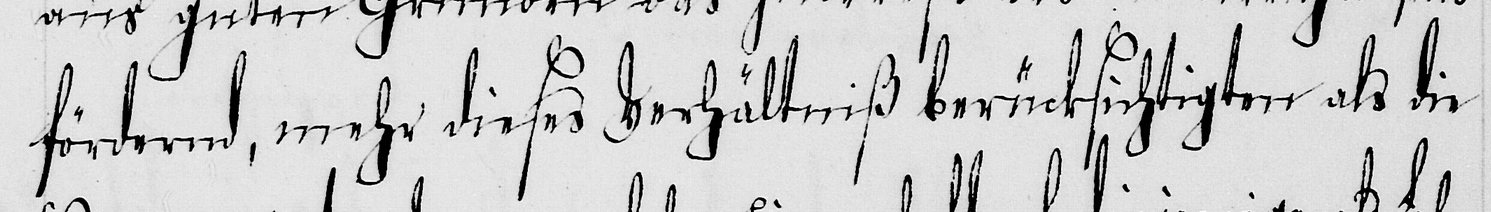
fördernd, mehr dieses Verhältniß berücksichtigten als die
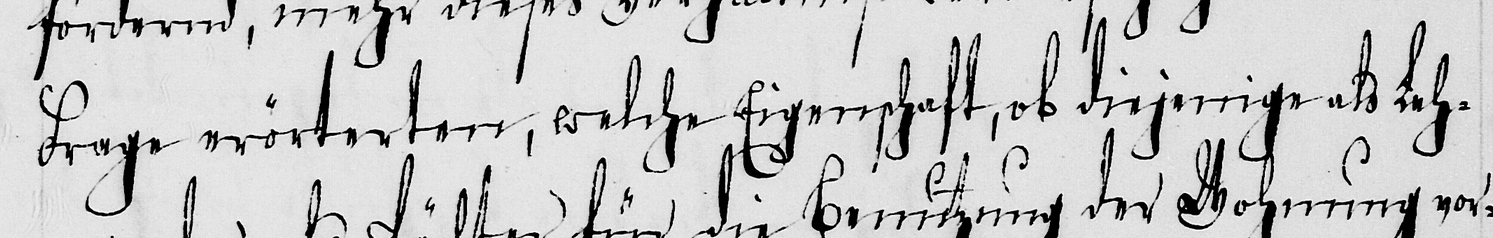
Frage erörterten, welche Eigenschaft, ob diejenige als Leh¬
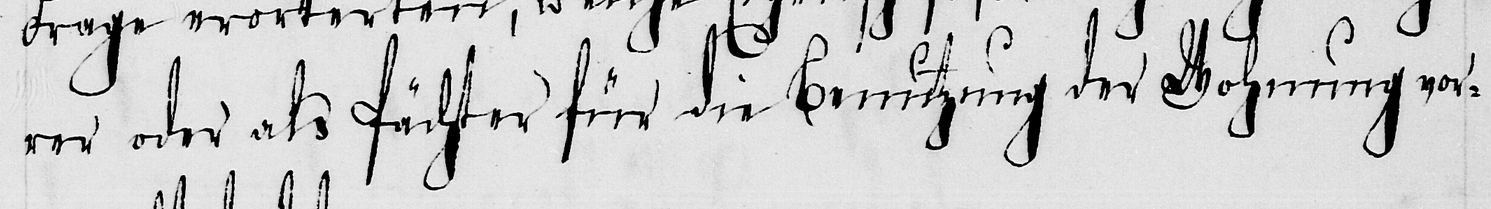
rer oder als Pächter für die Benutzung der Wohnung vor¬
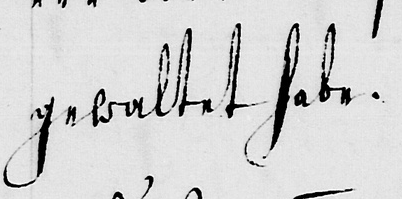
gewaltet habe.
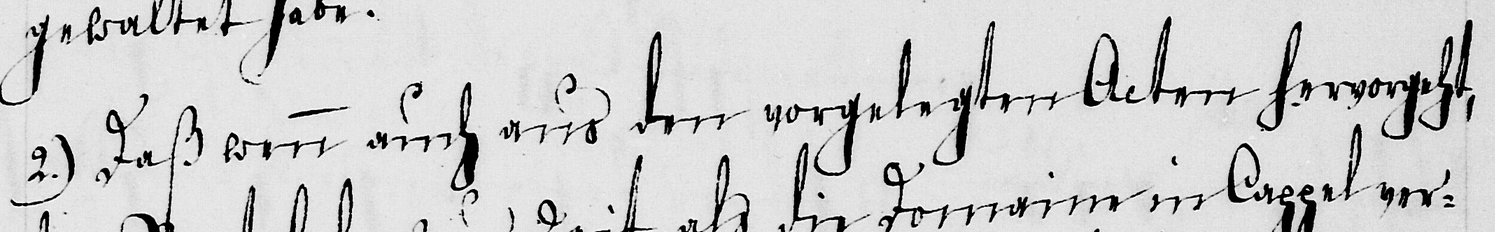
2.) Daß wenn auch aus den vorgelegten Acten hervorgeht,
